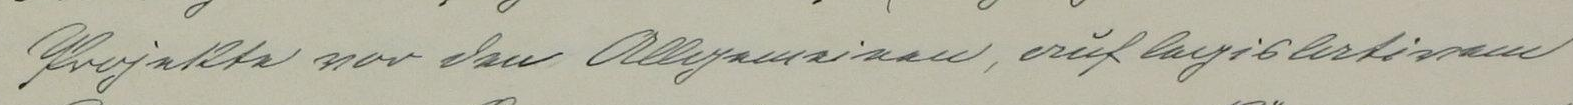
Projekte vor den Allgemeinen, auf legislativem
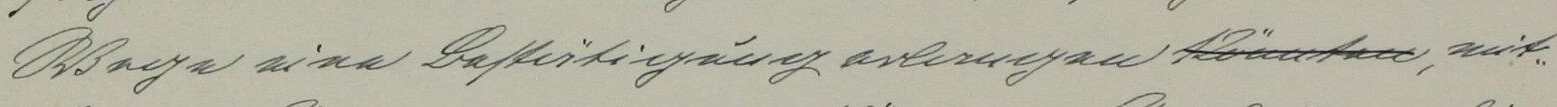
Wege eine Bestätigung erlangen könnten, mit-
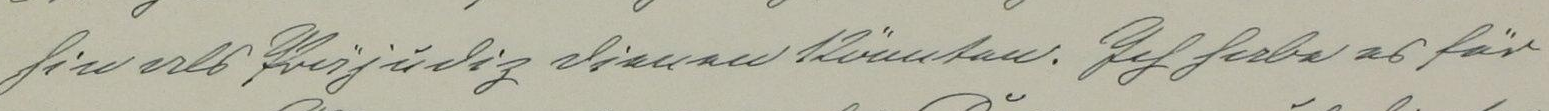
hin als Präjudiz dienen könnten. Ich habe es für
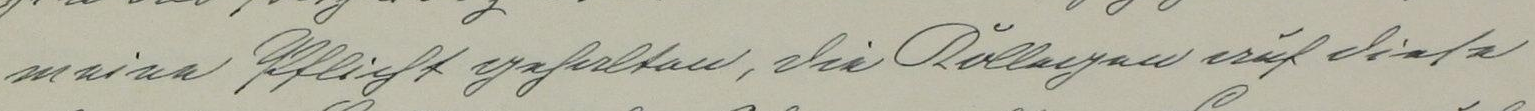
meine Pflicht gehalten, die Kollegen auf diese
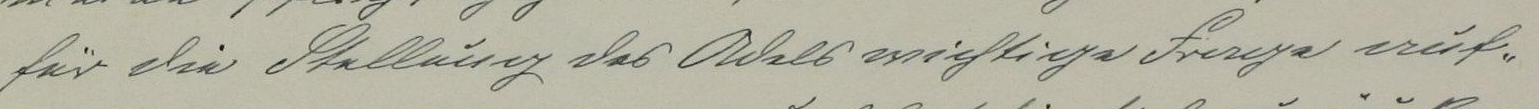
für die Stellung des Adels wichtige Frage auf-
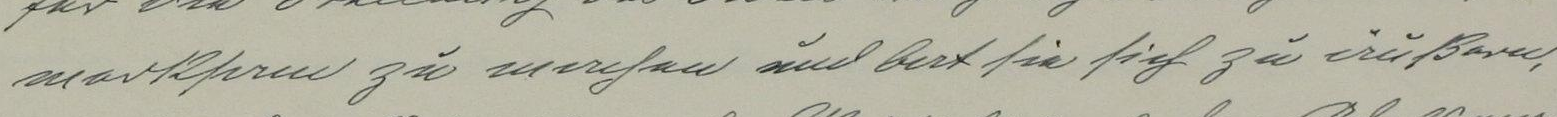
merksam zu machen und bat sie sich zu äußern,
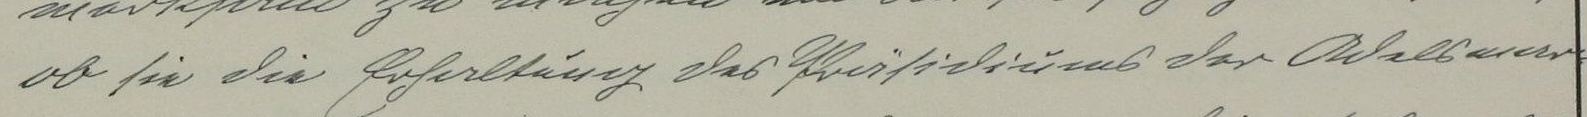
ob sie die Erhaltung des Präsidiums der Adelsmar-
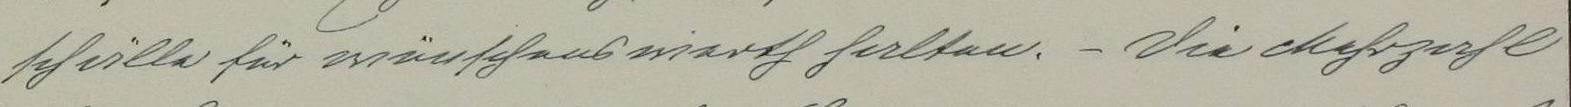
schälle für wünschenswerth halten. – Die Mehrzahl
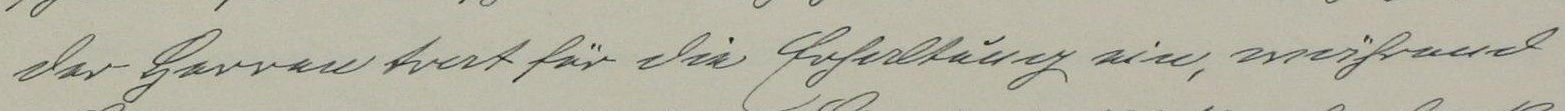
der Herren trat für die Erhaltung ein, während
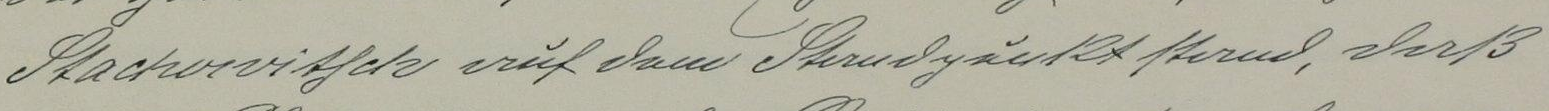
Stachowitsch auf dem Standpunkt stand, daß
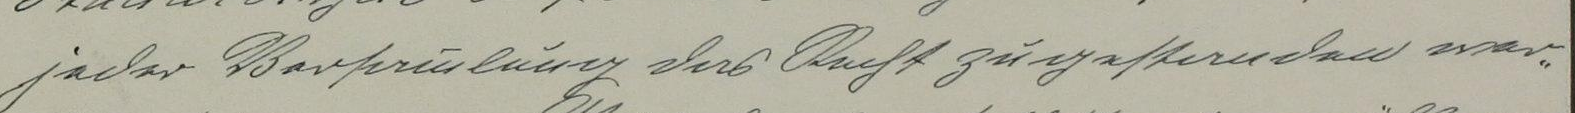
jeder Versammlung das Recht zugestanden wer-
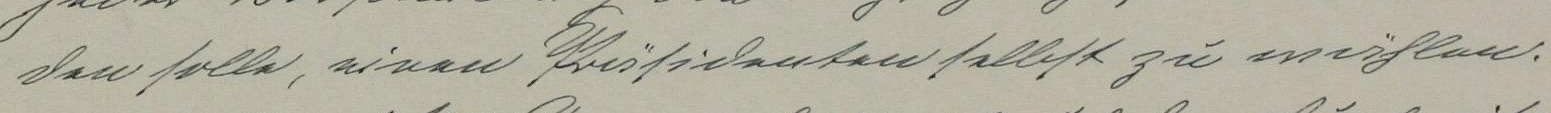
den solle, einen Präsidenten selbst zu wählen.
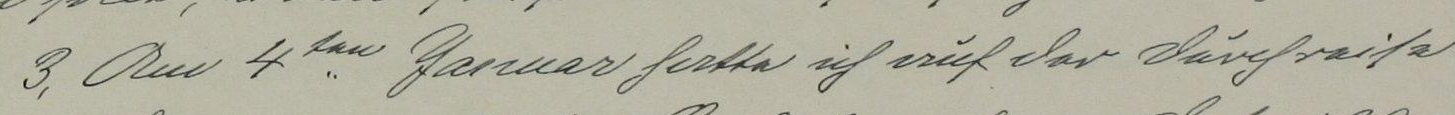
3. Am 4ten Januar hatte ich auf der Durchreise
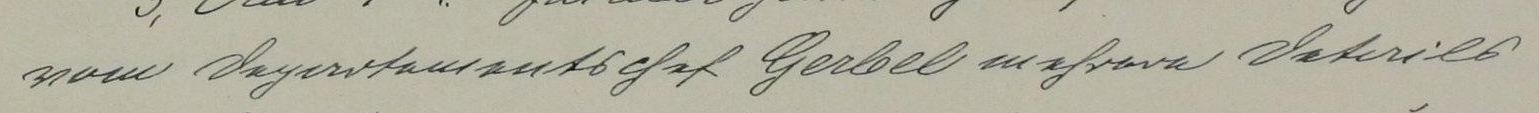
vom Departementschef Gerbel mehrere Details
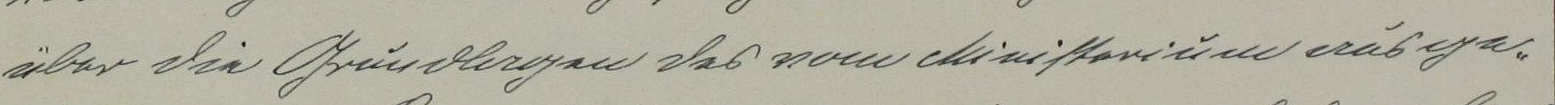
über die Grundlagen des vom Ministerium ausge-
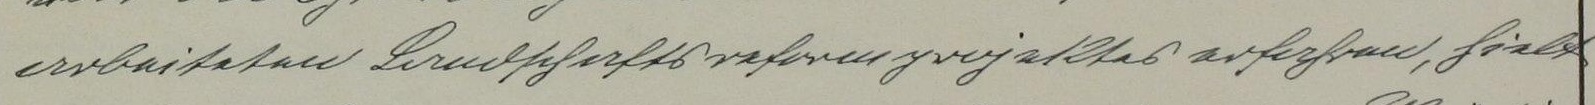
arbeiteten Landschaftsreformprojektes erfahren, hielt
